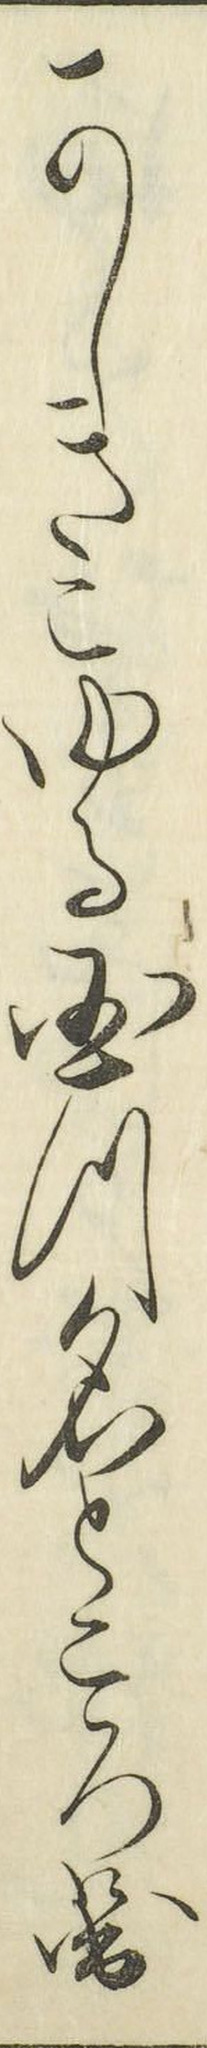かしきこゆる国つ名ところ図
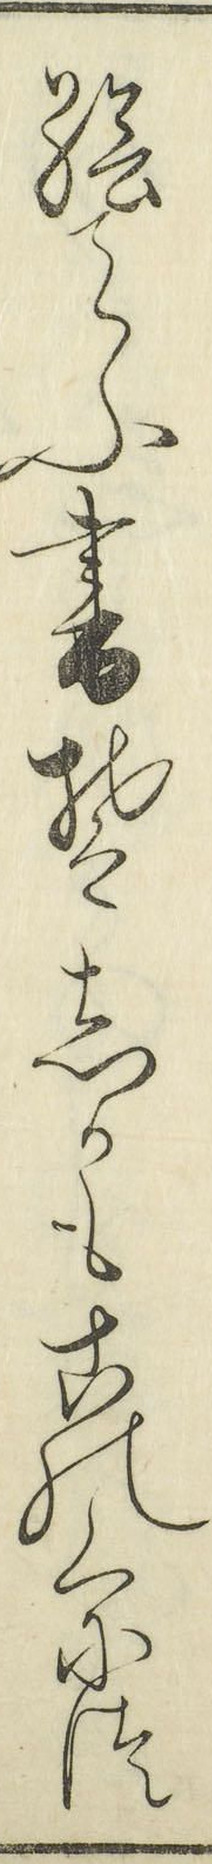絵てふ書そしかもこのくにつ
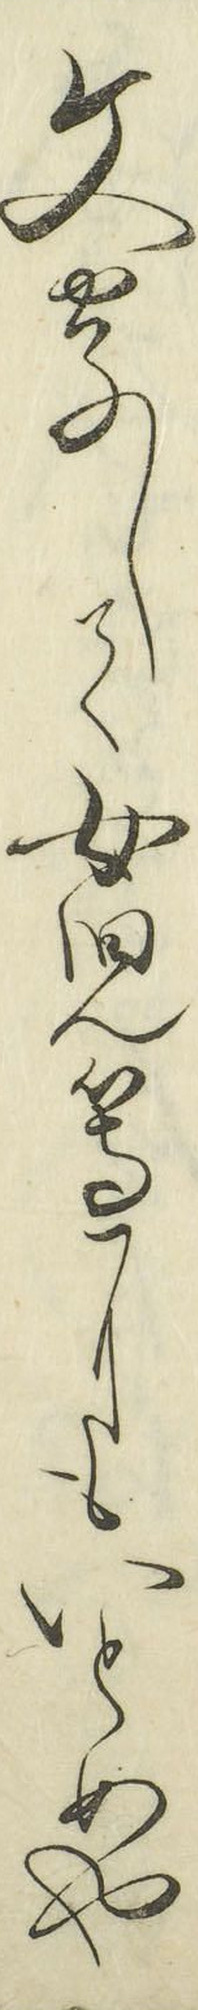文字して女児等にもいとめや
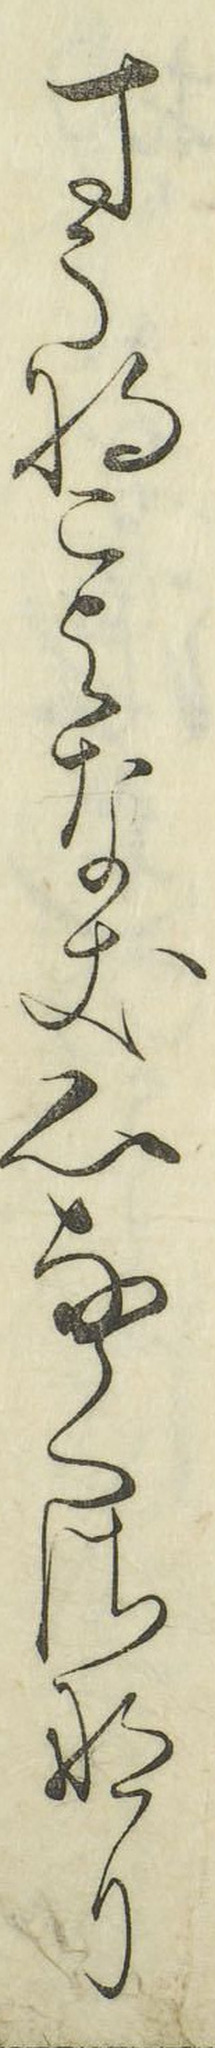すう将こよなき心なくさなり
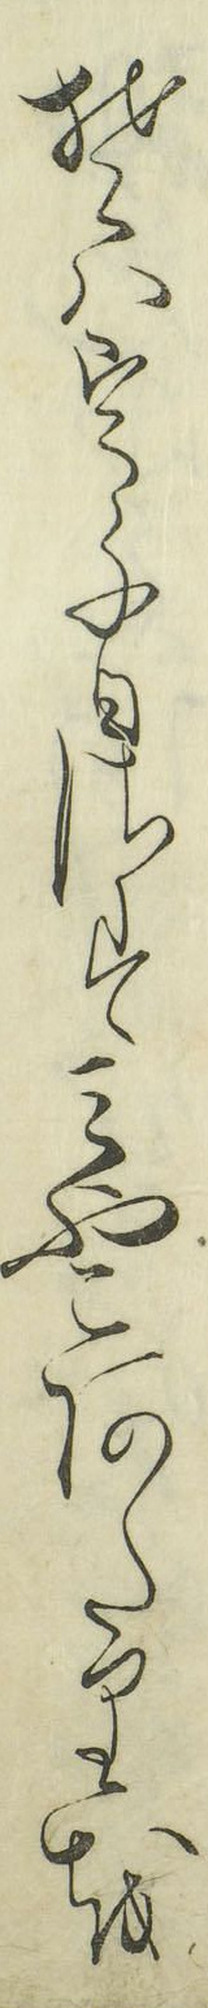そはうち日さすみやこあたりを

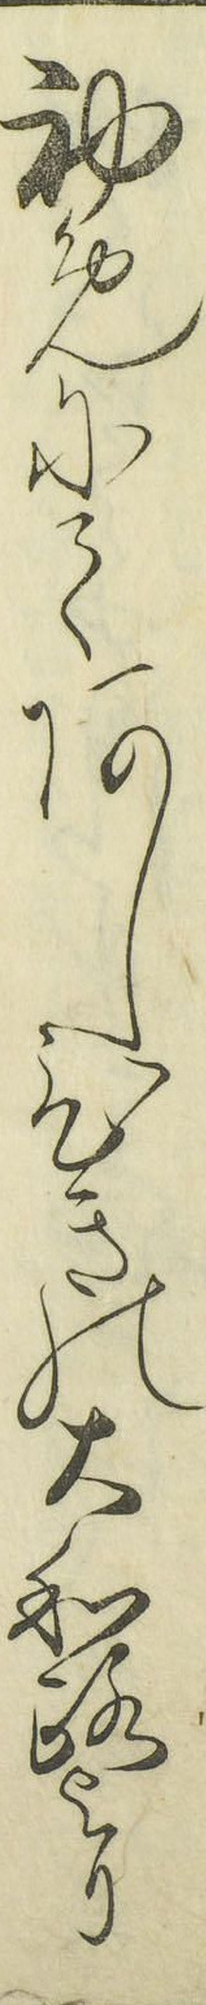初めにてあらひきの大和路より
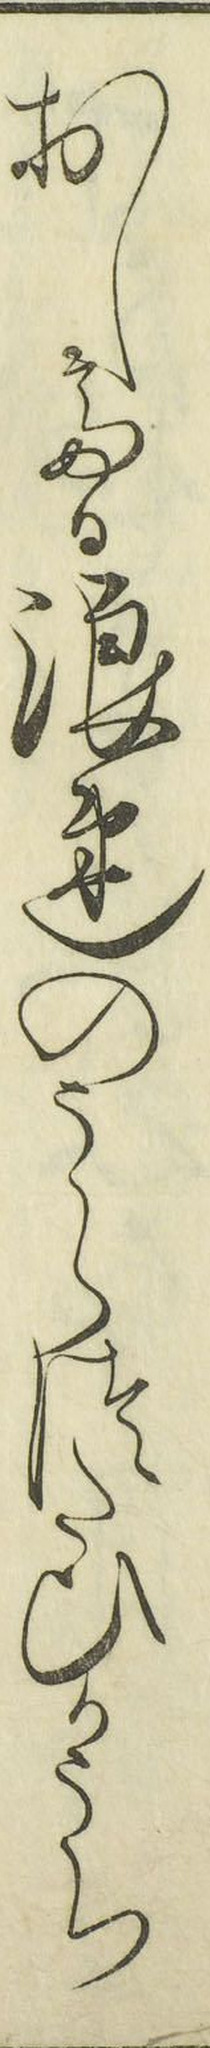おしてる浪速のうらつたひかうち
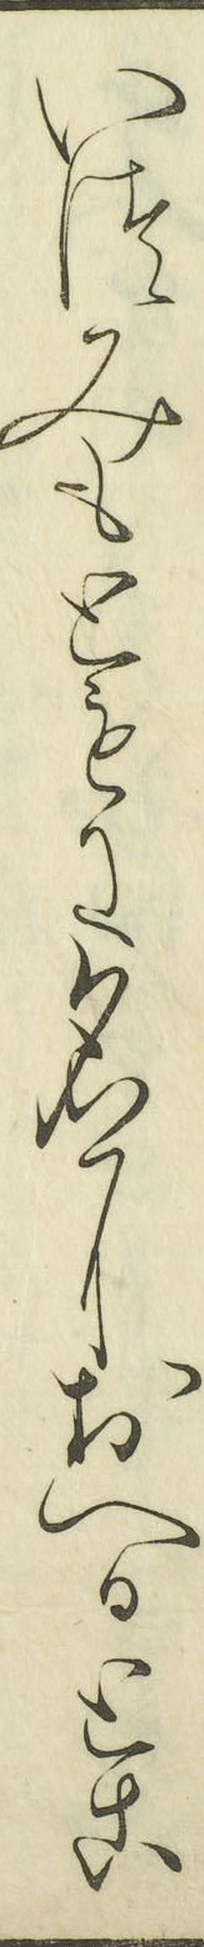いつみもともに名におへるとこ
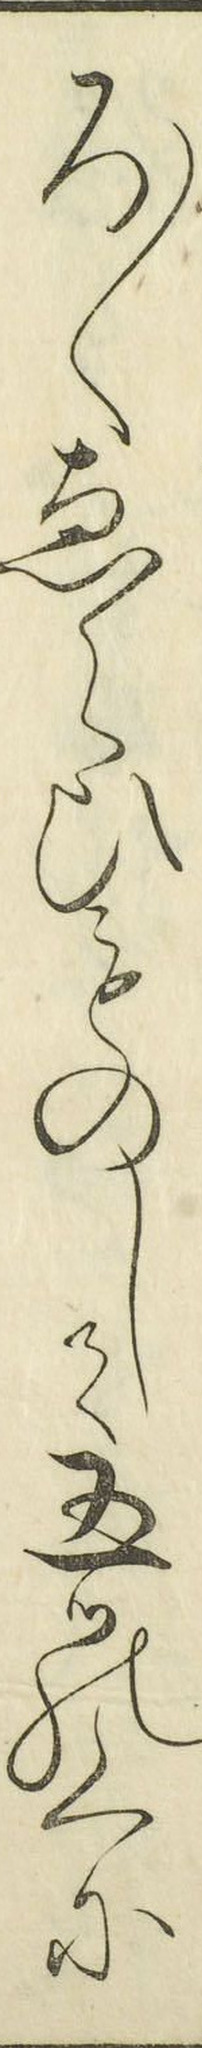ろ〳〵ゑらひものして五つのくに
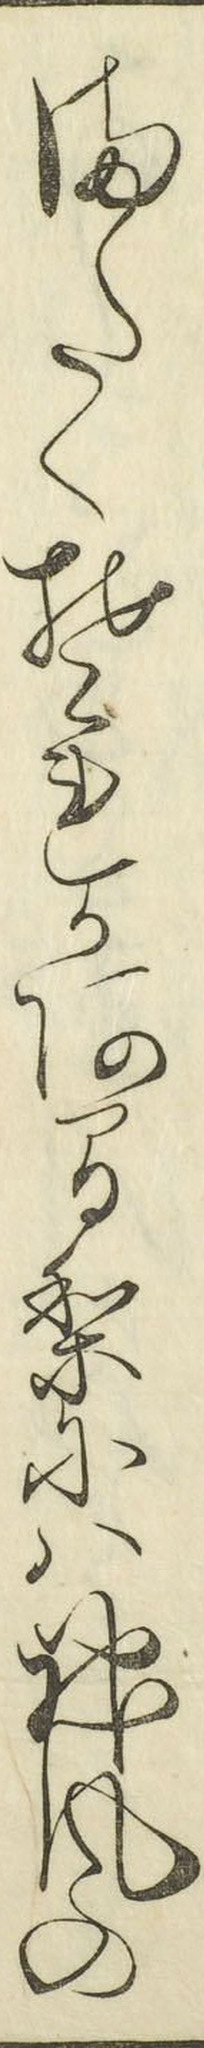またくそれかあまりには神風の
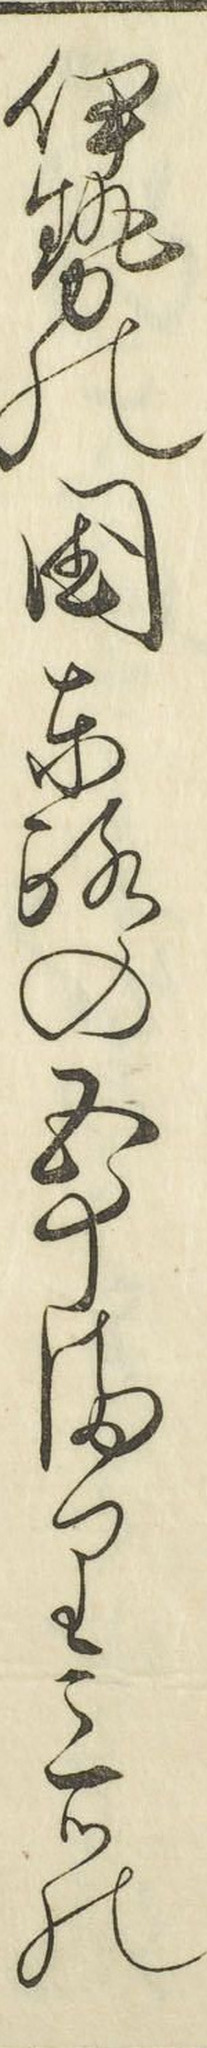伊勢の国東路の五十まり三つの
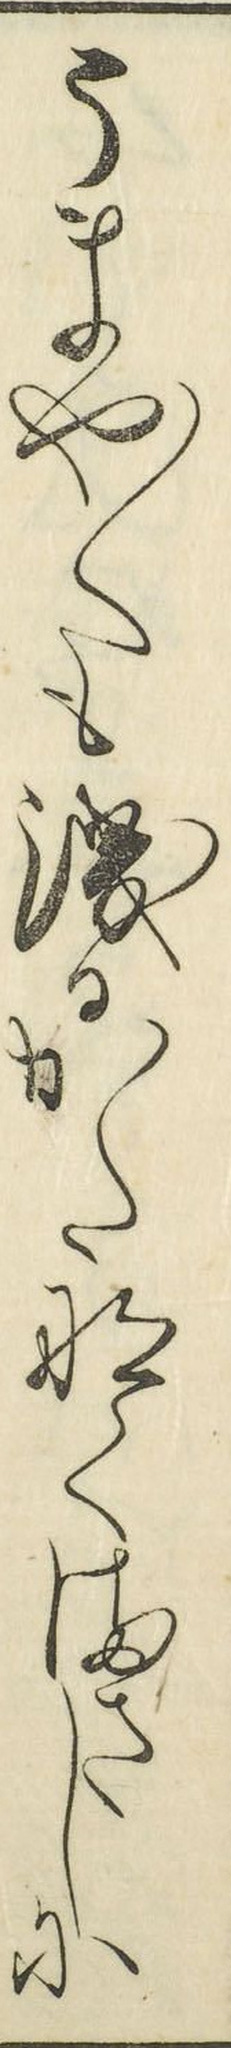うまや〳〵も洩るかたなくまさしに
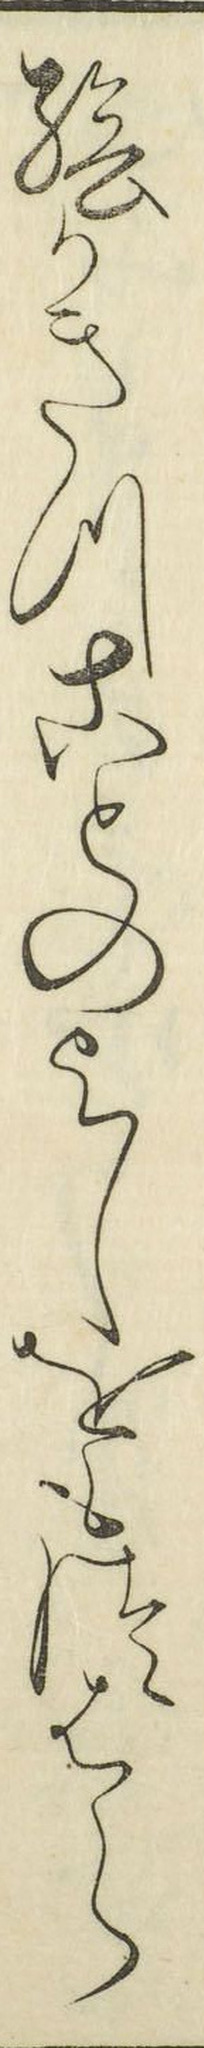絵かきつことのよしをもつはら
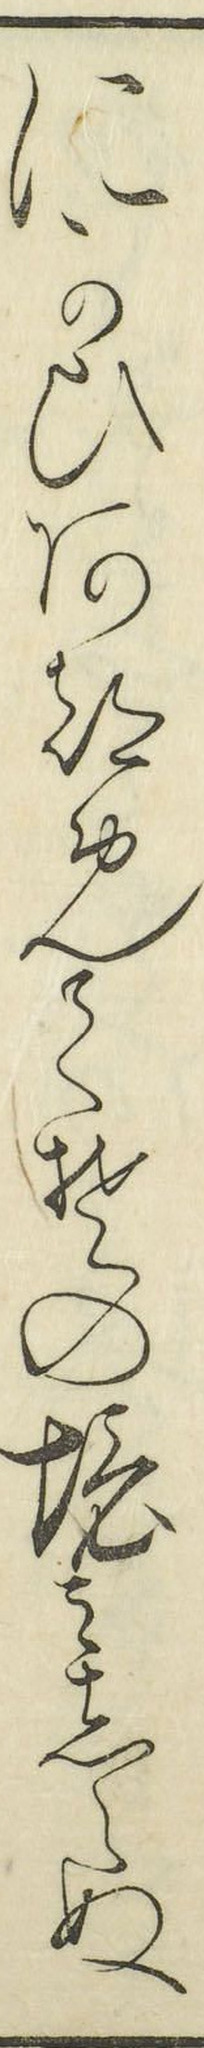にかひあつめてその境えしらぬ
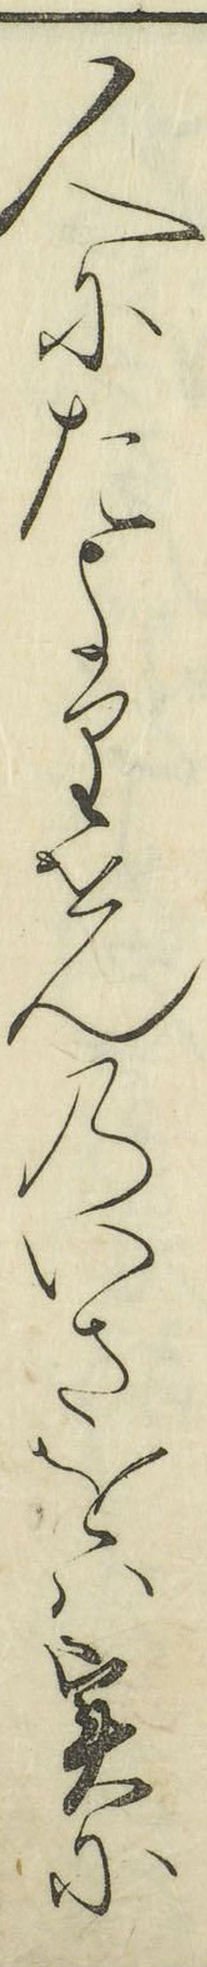人にたより先のいさをは実に
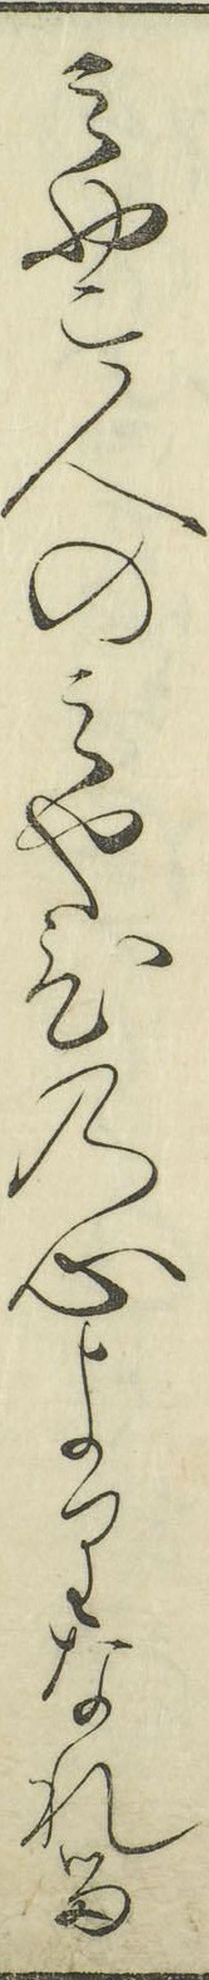みやこ人のみやひの心よりなれる
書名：江戸名所図会 20巻 巻之1
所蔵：東京学芸大学教育コンテンツアーカイブ
